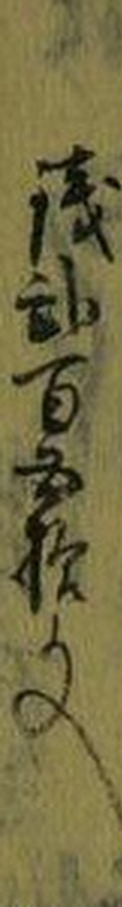銭弐百五拾文
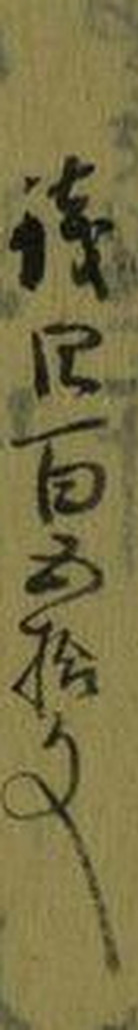銭四百五拾文
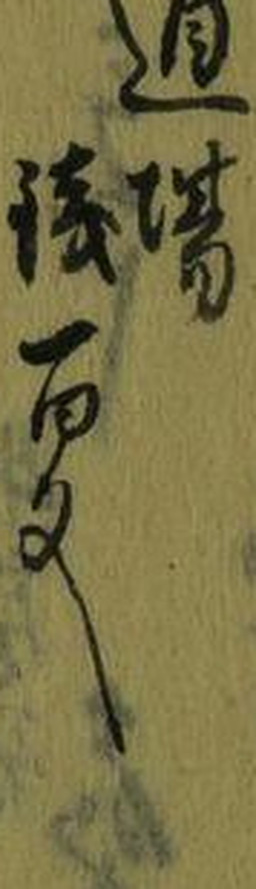銭百文
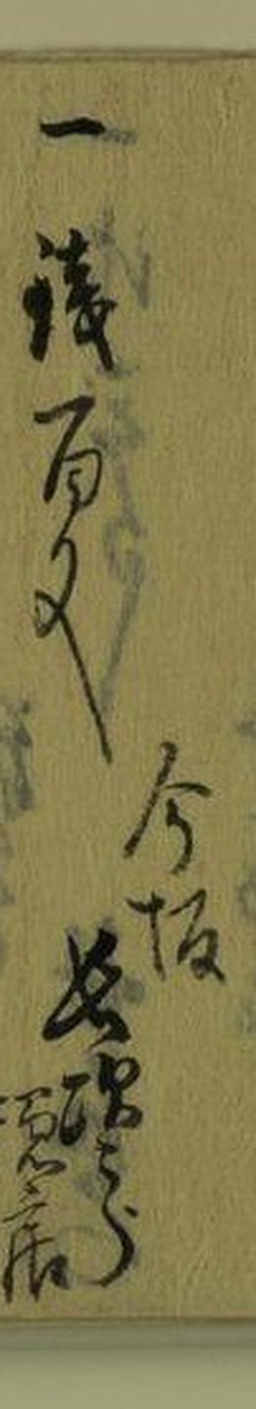一銭百文長次郎

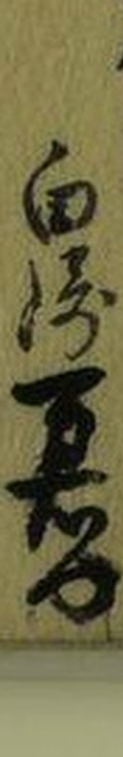白崎万右衛門
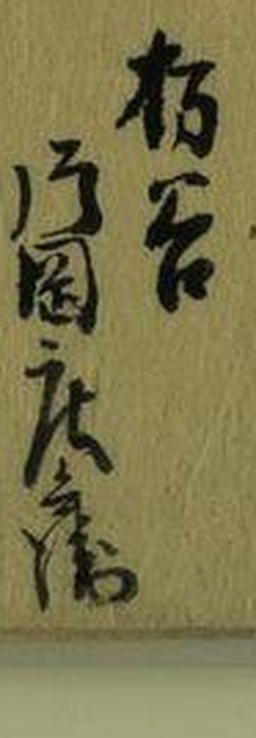片岡庄兵衛
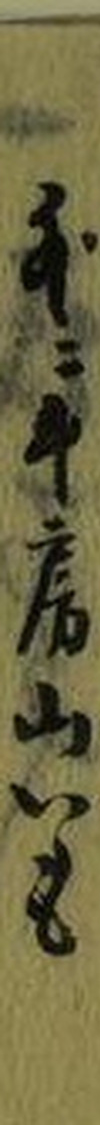外ニ牛房山いも
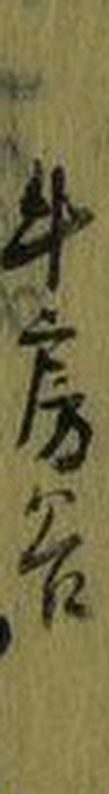牛房谷
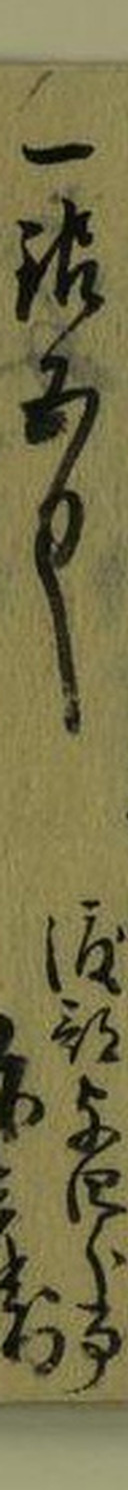一銀五匁渡部与四郎事
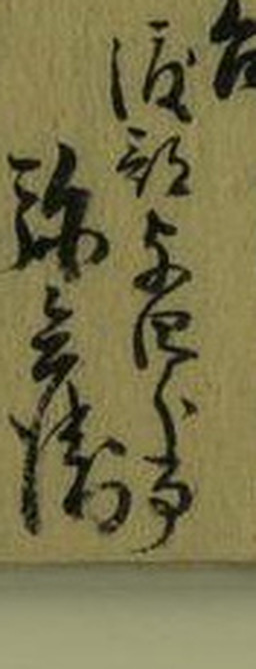弥兵衛
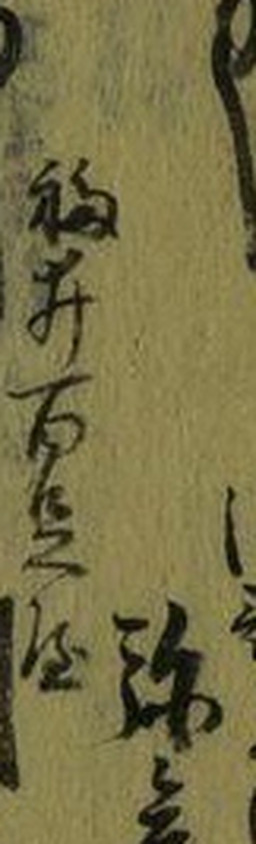福井百足屋
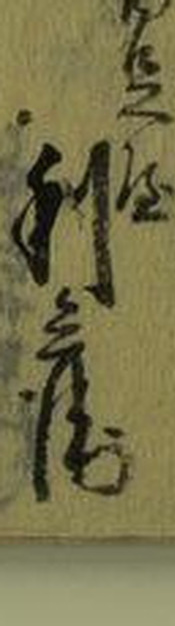弥兵衛
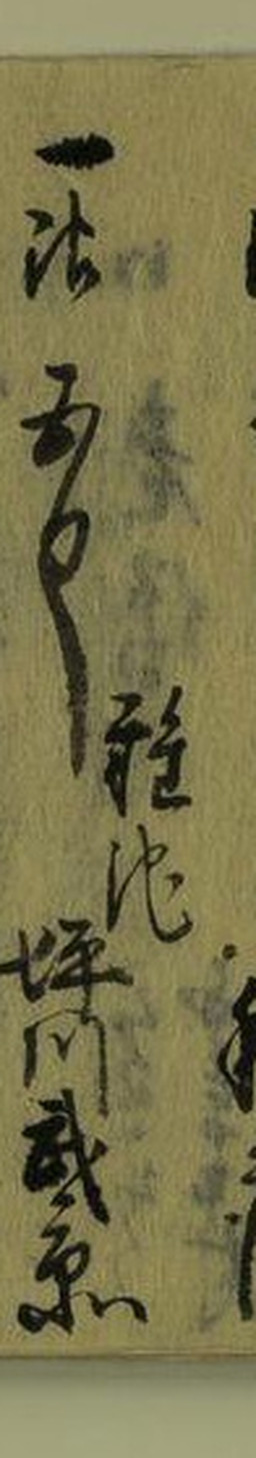一銀五匁坪川武兵衛
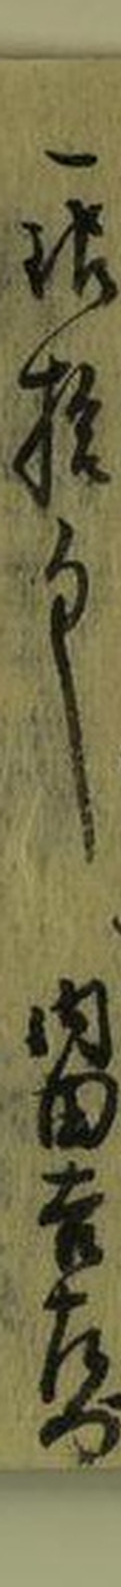一銀拾匁内田吉左エ門
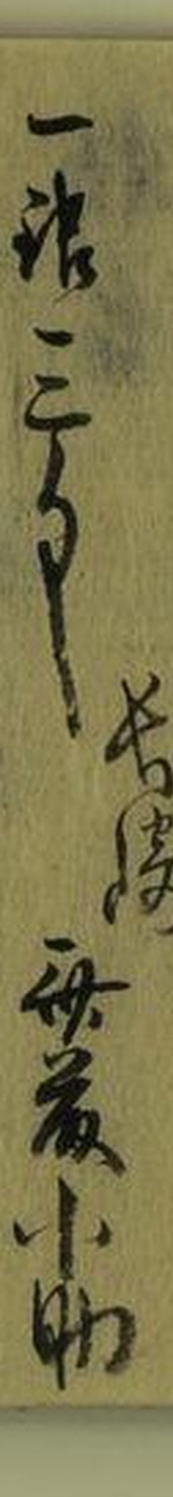一銀三匁斎藤小助
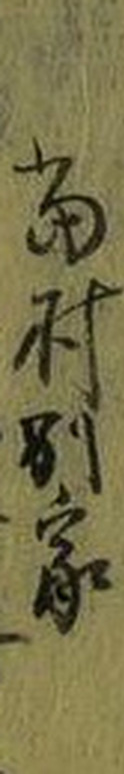当村別家
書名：（献立覚）
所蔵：福井県文書館 Fukui Prefectural Archives
